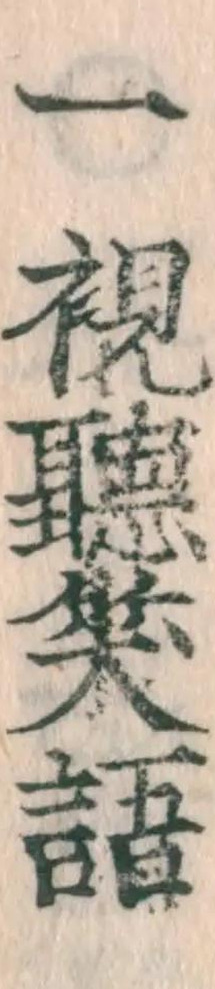一視聴笑語

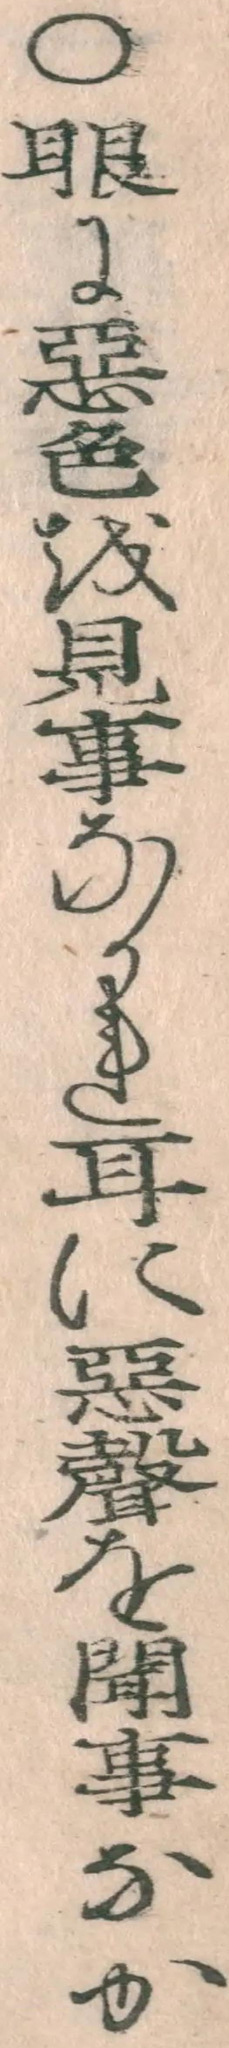〇眼に悪色を見事なかれ耳に悪声を聞事なか
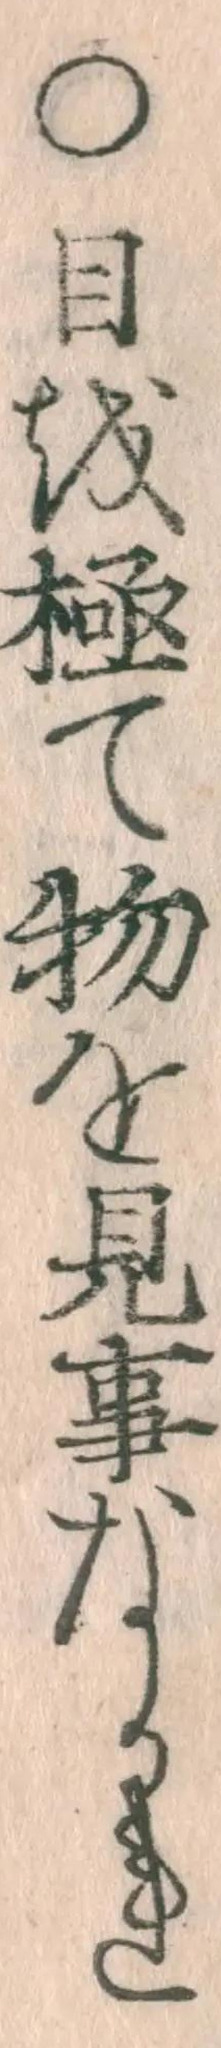〇目を極て物を見事なかれ
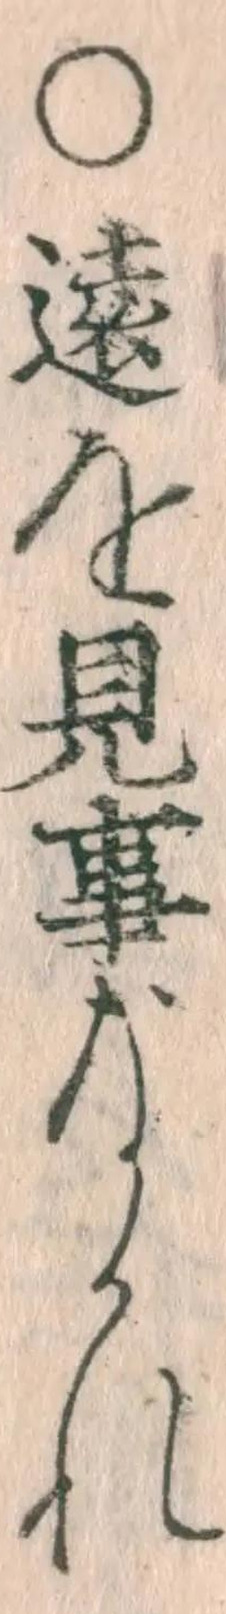〇遠を見事なかれ
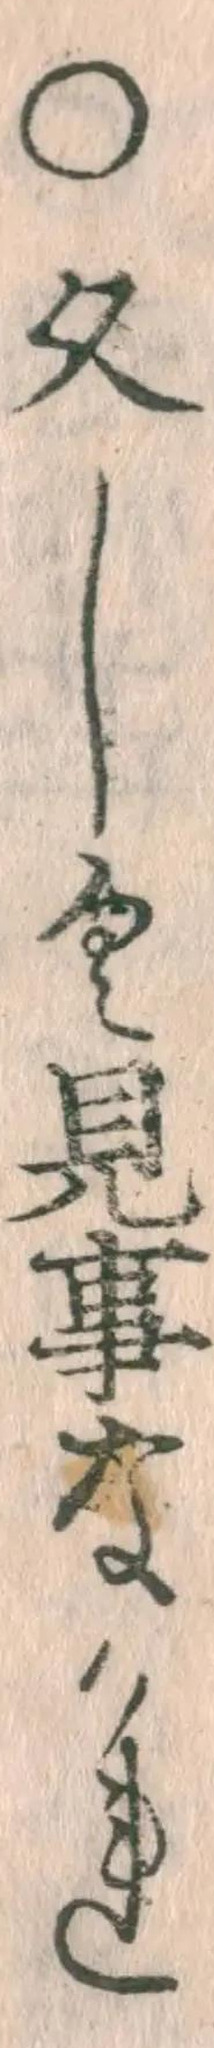〇久しく見事なかれ
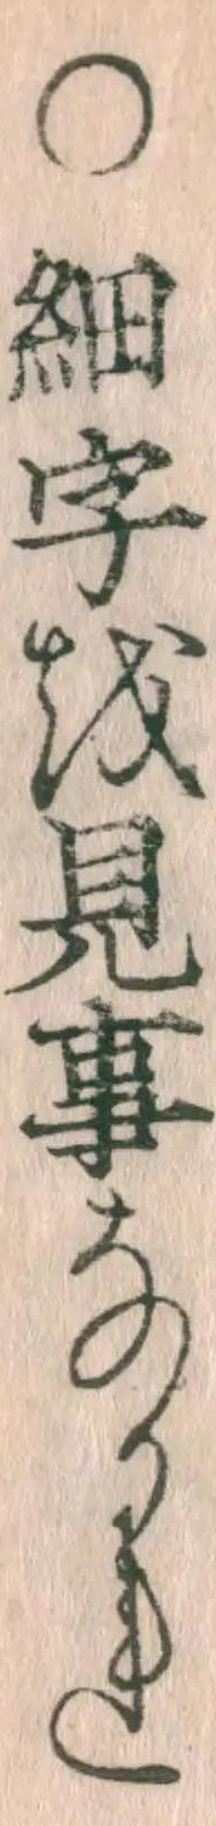〇細字を見事なかれ
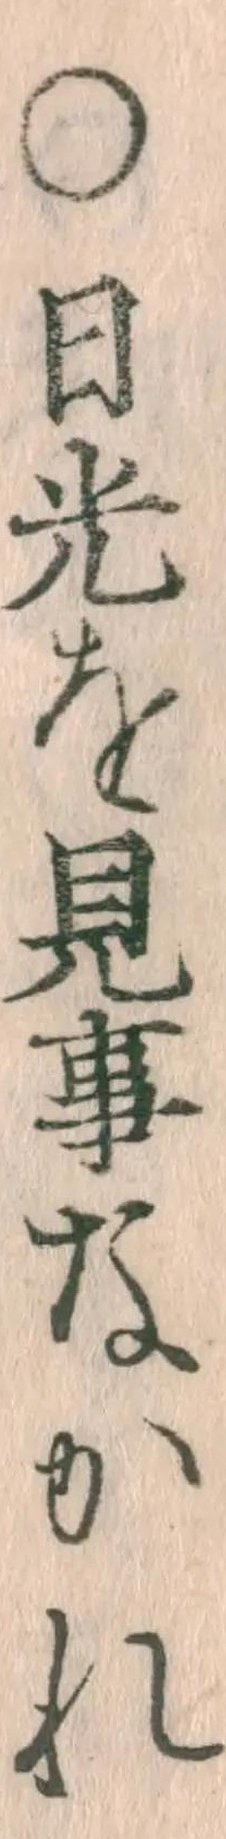〇日光を見事なかれ
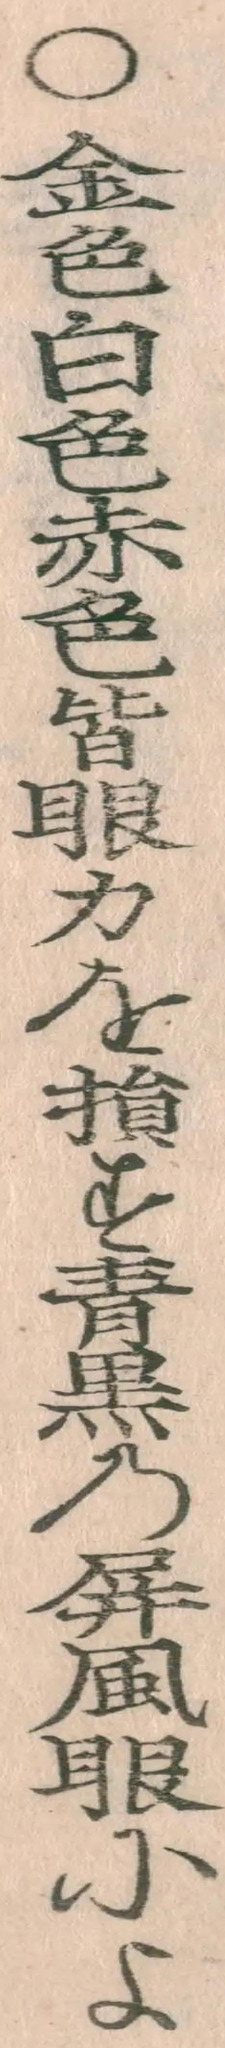〇金色白色赤色皆眼力を損す青黒の屏風眼によ
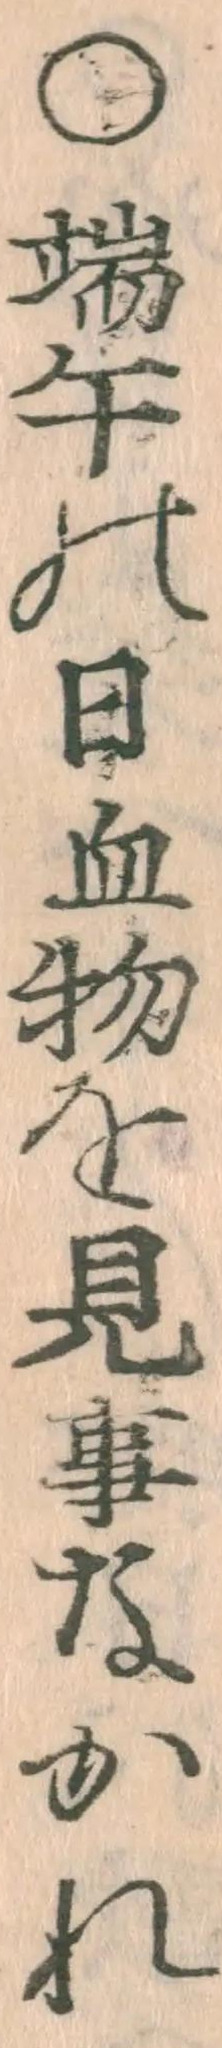〇端午の日血物を見事なかれ
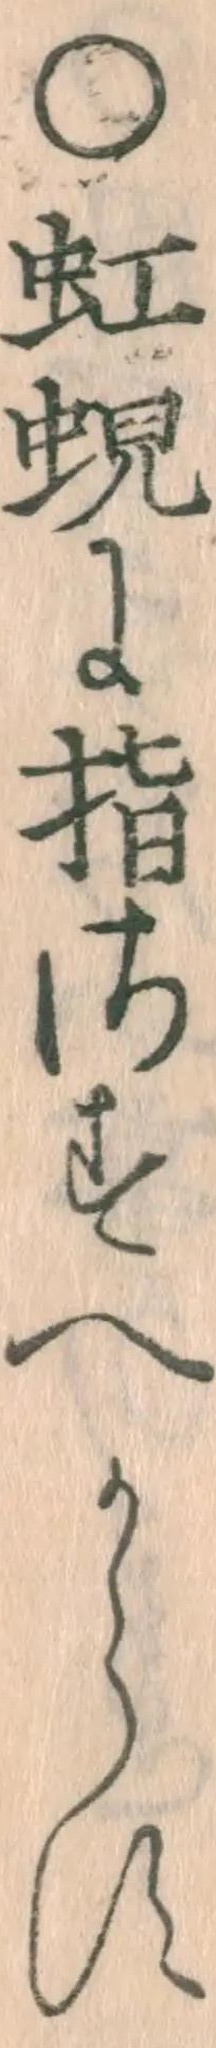〇虹蜆に指さすへからす
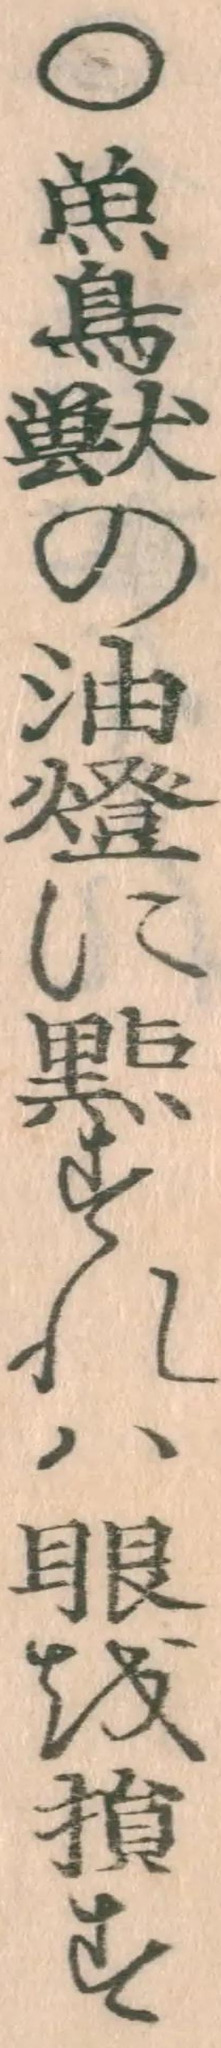〇魚鳥獣の油灯に点すれは眼を損す
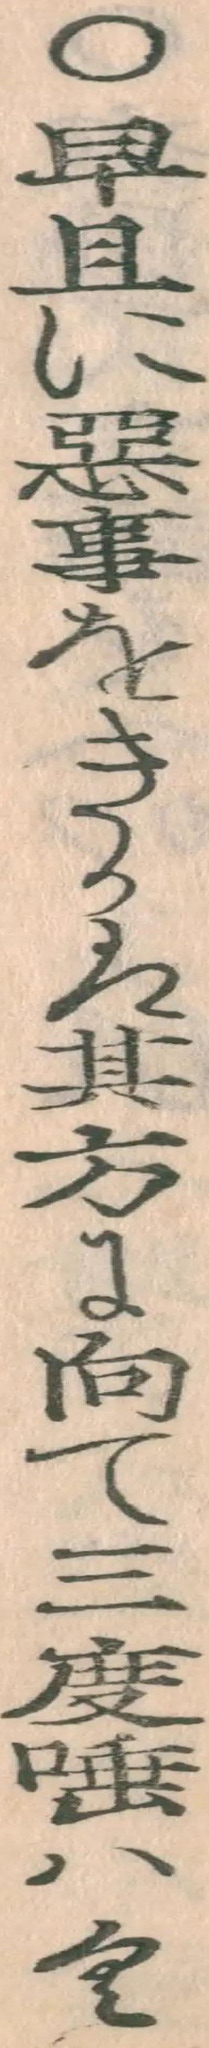〇早旦に悪事をきかは其方に向て三度唾はく
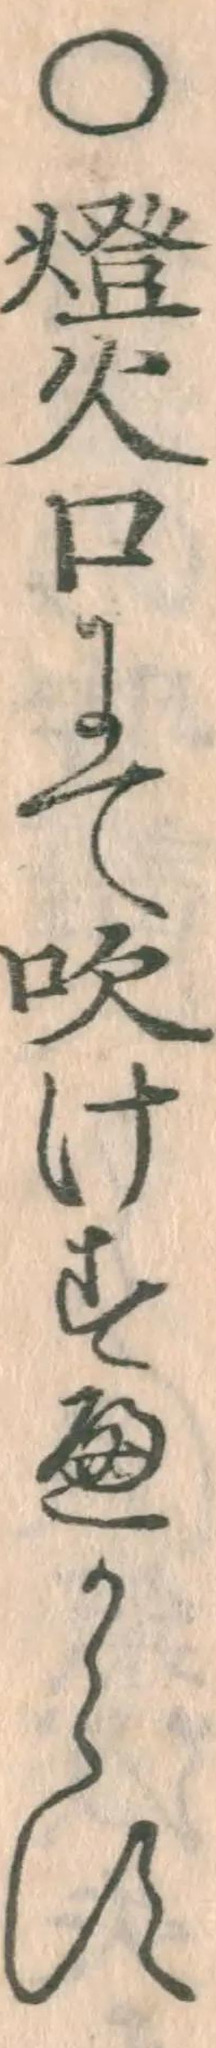〇灯火口にて吹けすへからす
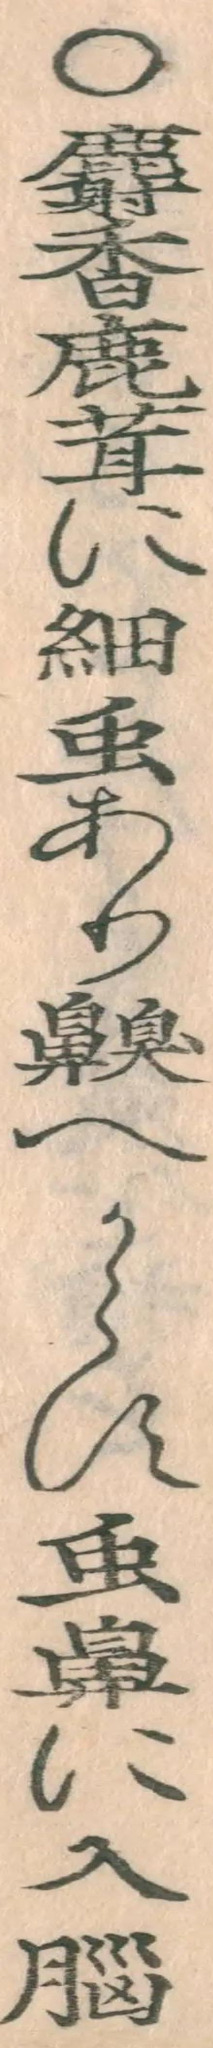〇麝香鹿茸に細虫あり齅へからす虫鼻に入脳
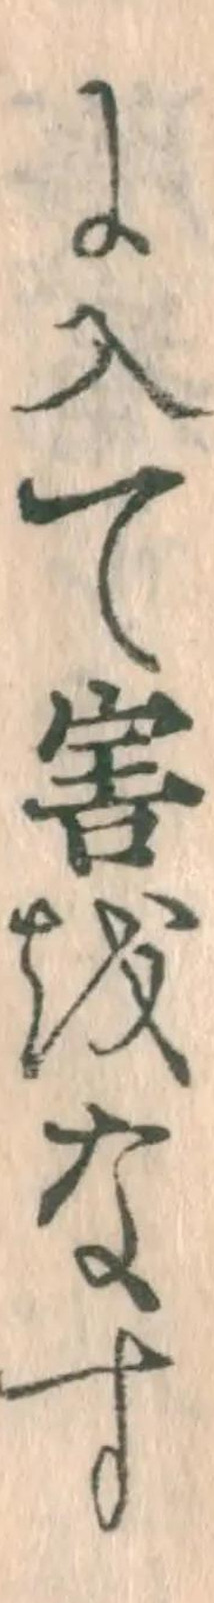に入て害をなす
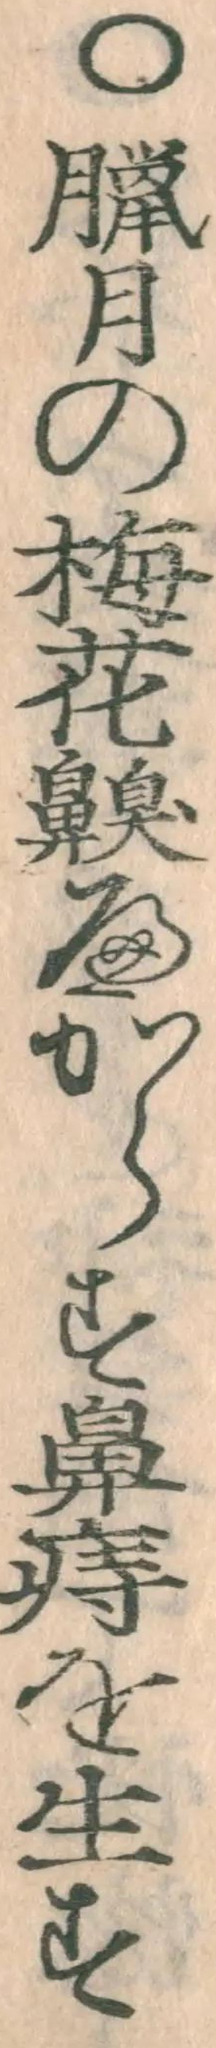〇臘月の梅花齅へからす鼻痔を生す
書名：延壽撮要
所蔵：国立国会図書館 National Diet Library, JAPAN
